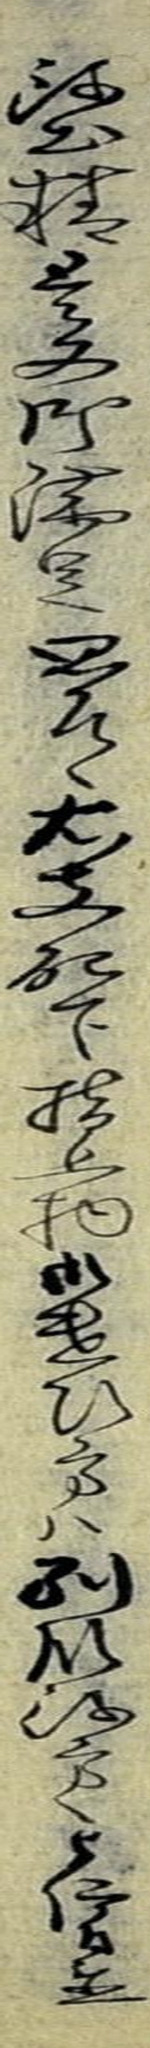致出精是又御満足思召候右支配下指上物御遣ひ方は別段役方へ被仰付置
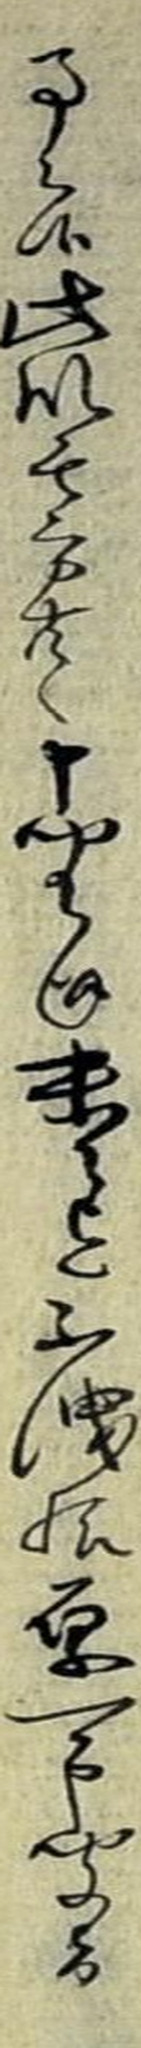事に候此段其方共へ申聞候趣末々迄不洩様厚可申聞旨
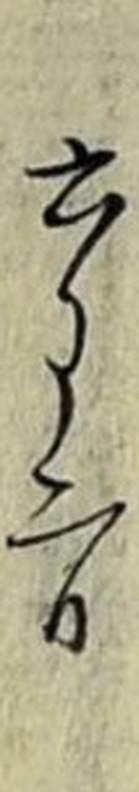六月二日
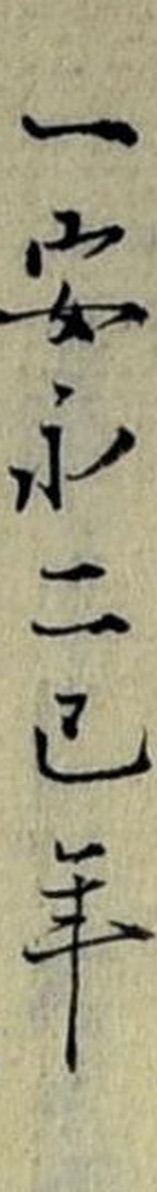一安永二巳年
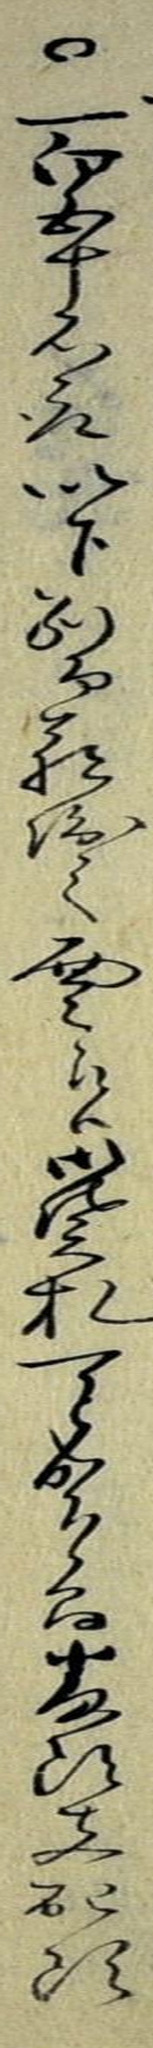〇百五十石取以下別而難儀之面々えは御貸札可被成下候間番頭支配頭
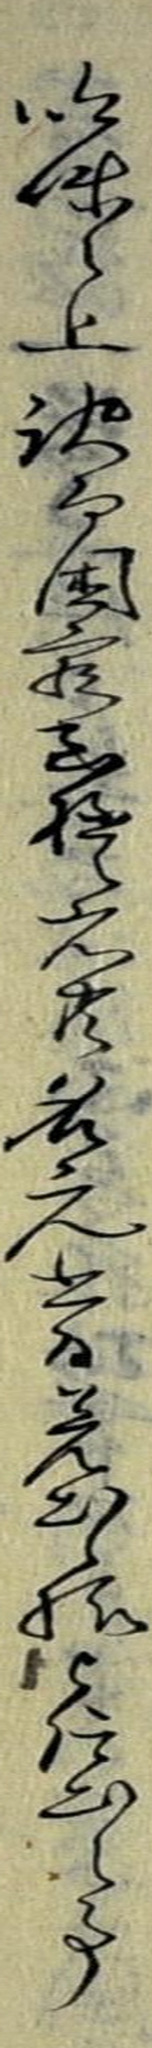吟味之上訳而困窮至極之者共名元書付差出候様被仰出候事
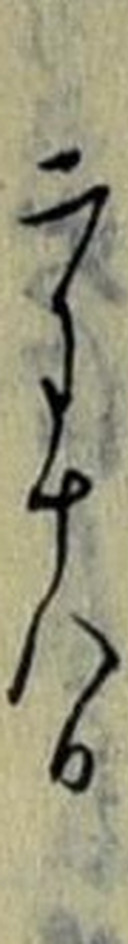二月十八日
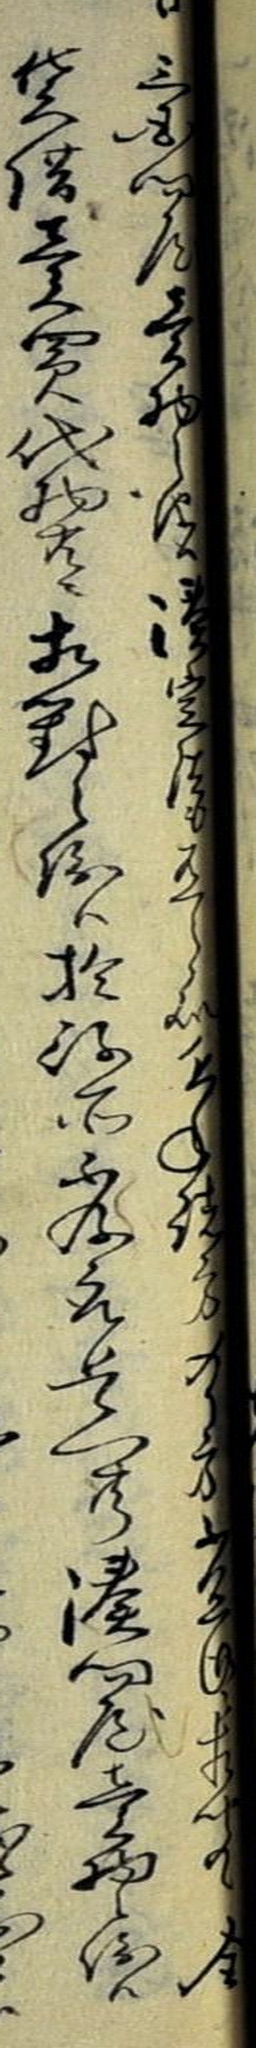貸借売買代物共に相対之儀は於役所不及取上候へ共湊問屋売物之儀は
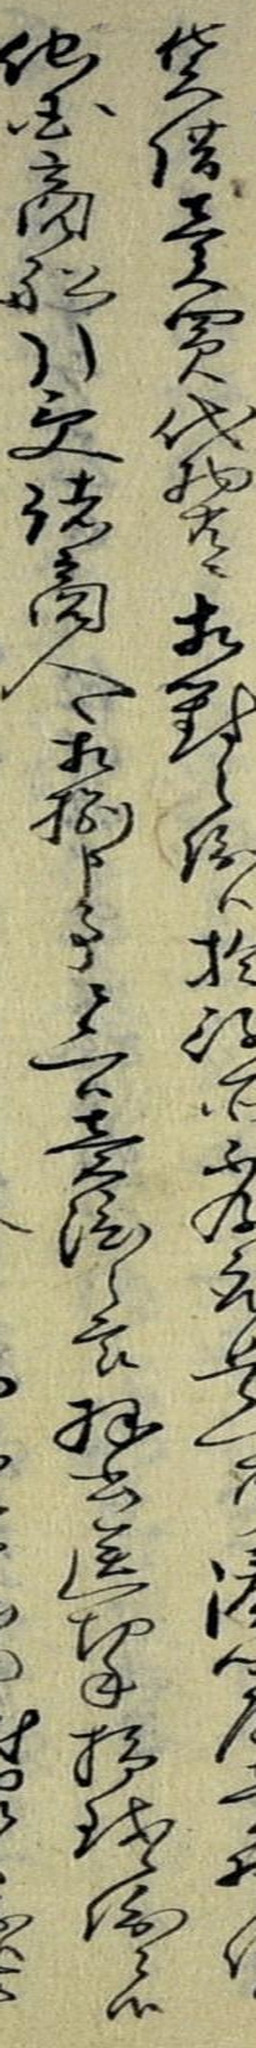他国商船引受諸商人へ相捌申事に候へは売渡之節拝書送切手指越候儀に候
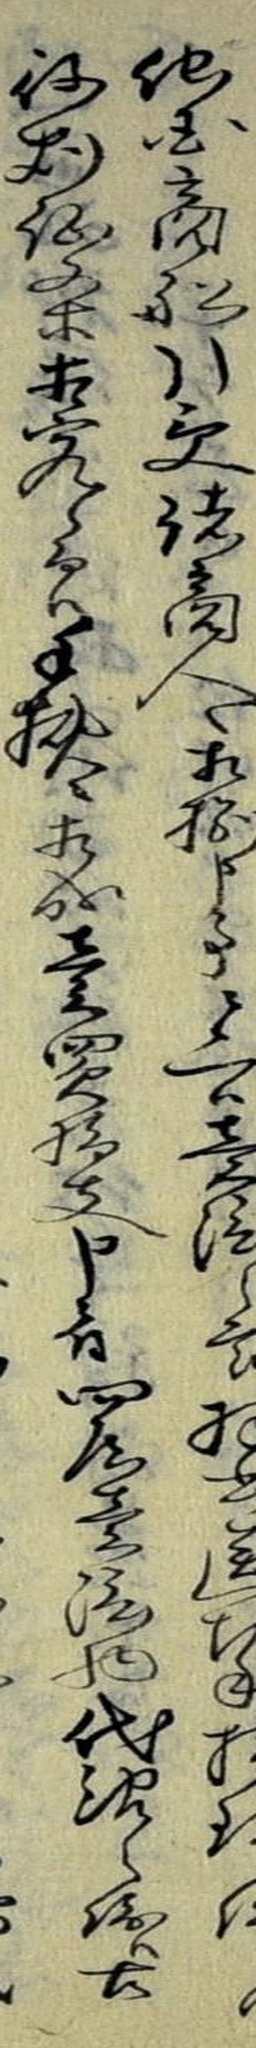役判証文等相究候而は手狭に相成売買指支申に付問屋売渡物代銀之儀は古
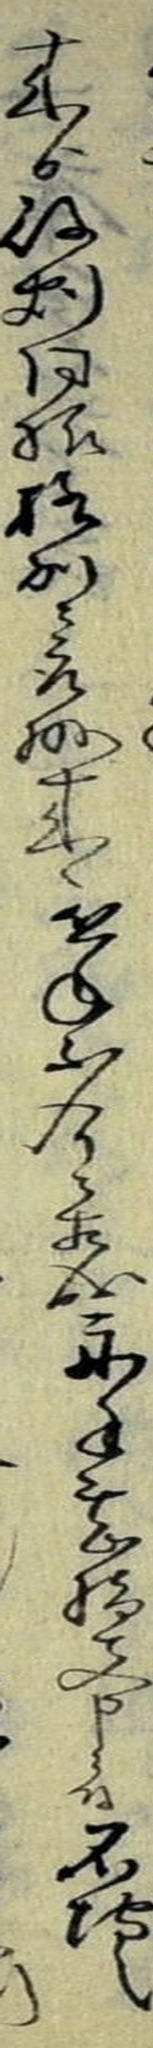来ゟ役判同様格別に取扱来候近年不〆りに相成舟手甚指支申に付不埒之
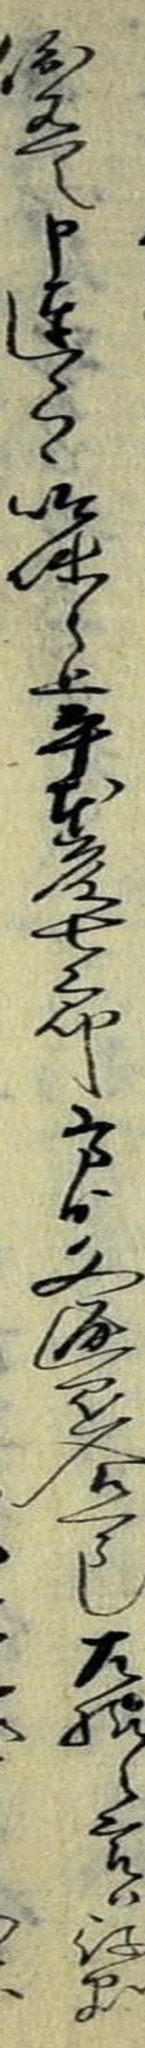儀有之申達候はゝ吟味之上平本藤七郎方ゟ文通懸合可申候左様之節は役判
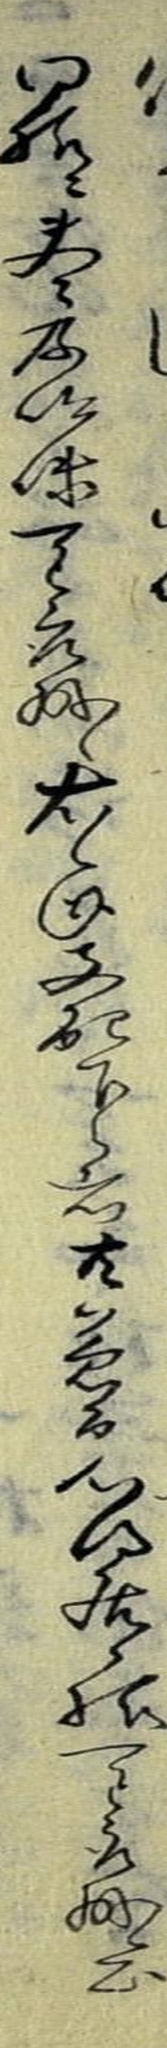同様に夫々及吟味可被取扱候右之趣支配下之者共兼而心得居候様可被取扱候以上
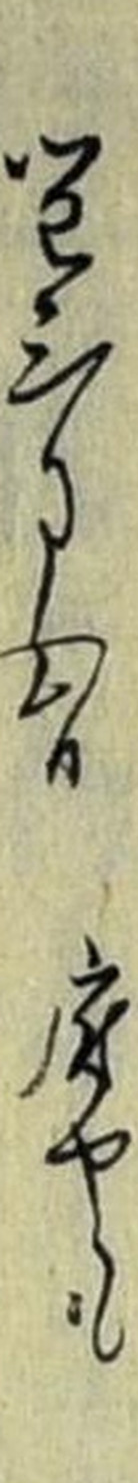閏三月五日府中へも
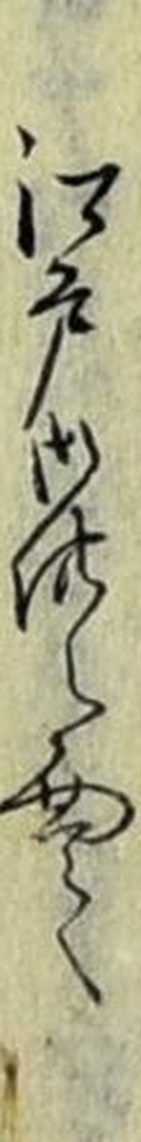江戸御供之面々へ
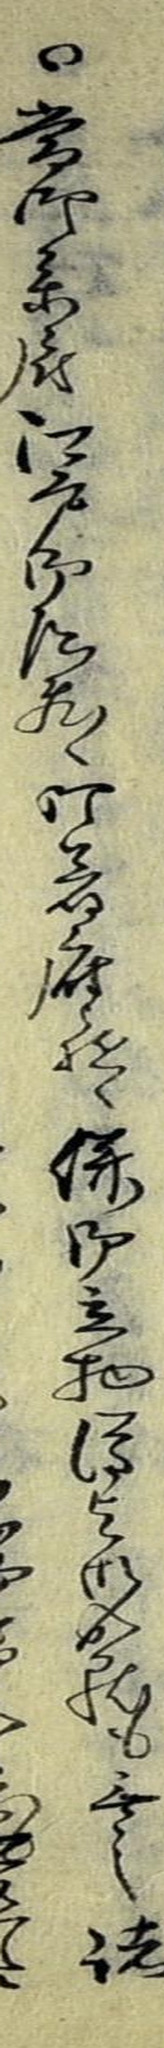〇当御参府江戸御屋敷へ御着府被遊候併御立物得与御成就も無之諸
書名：命令之部 二
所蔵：福井県文書館 Fukui Prefectural Archives
